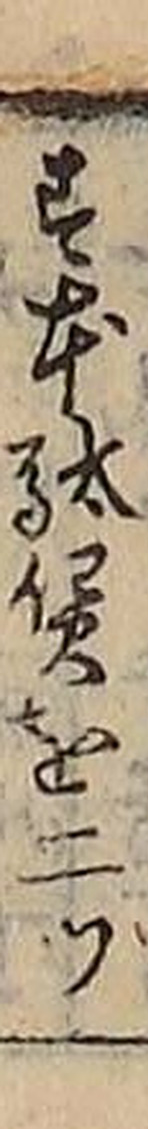す本駄賃を二つ
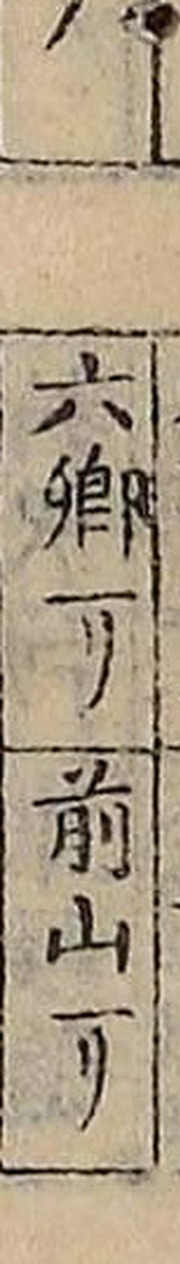六卿一リ前山一リ
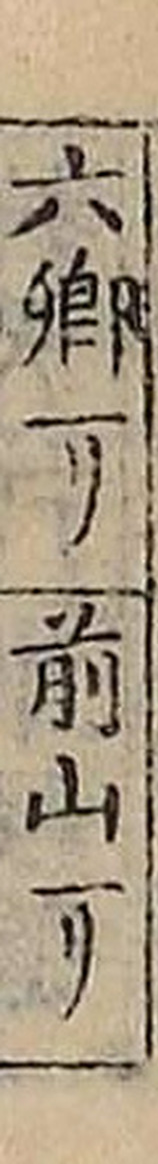六卿一リ前山一リ
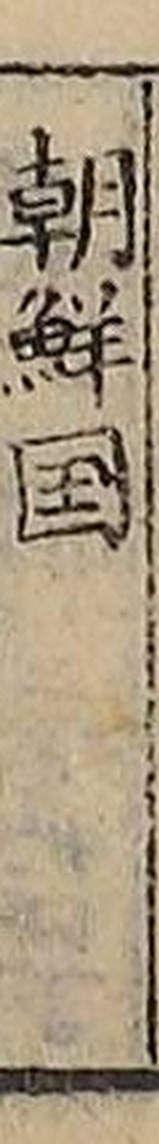朝鮮国
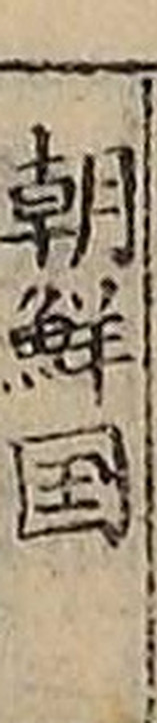朝鮮国
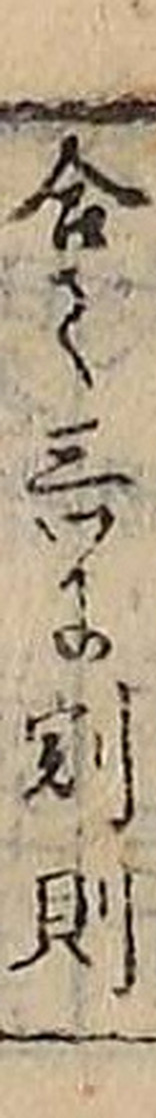合て三つに割則
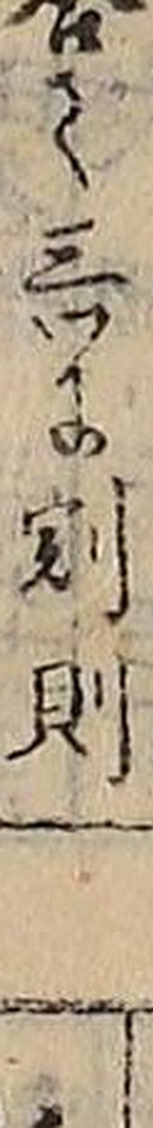合て三つに割則
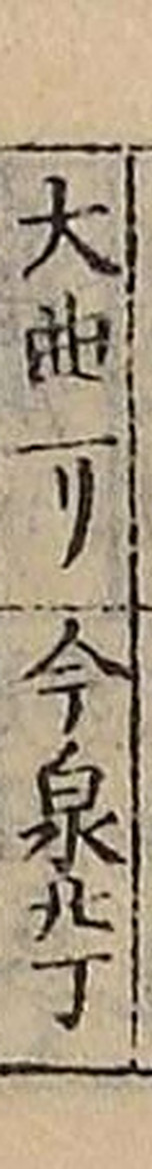大曲一リ今泉廿丁
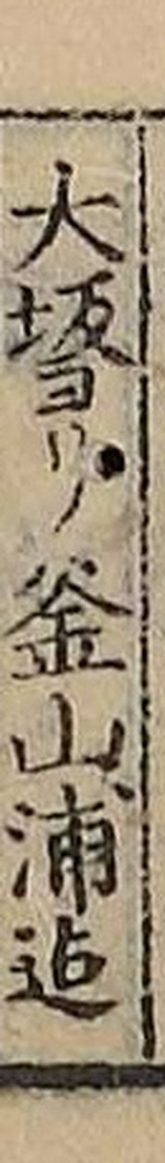大坂ヨリ釜山浦迄
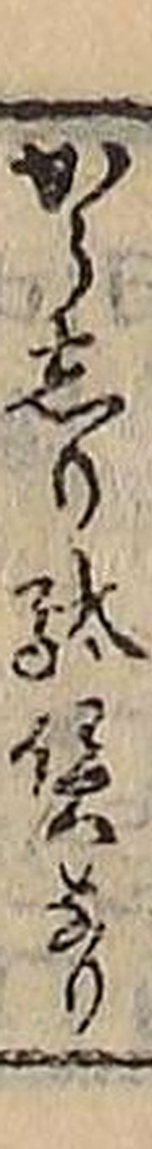からしり駄賃なり
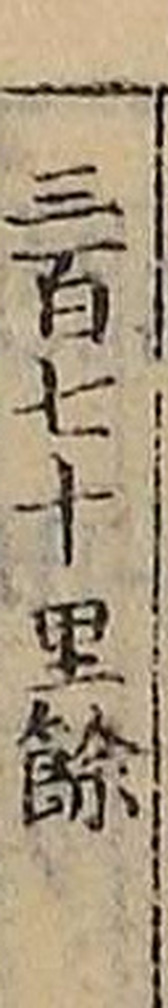三百七十里余
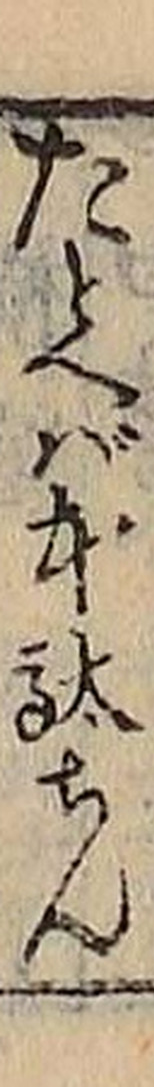たとへば本駄ちん
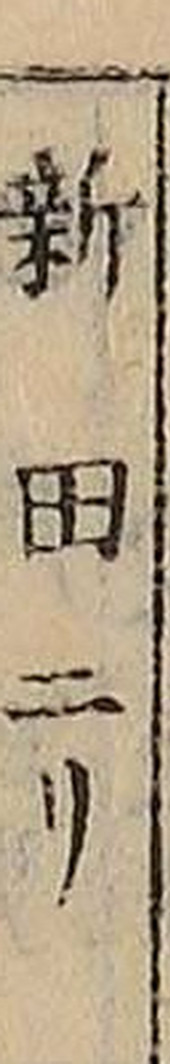新田二リ
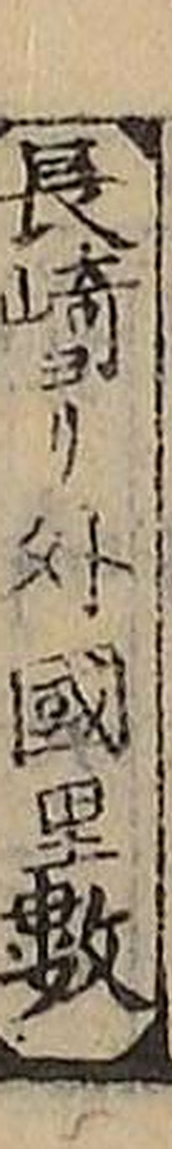長崎ヨり外国里数
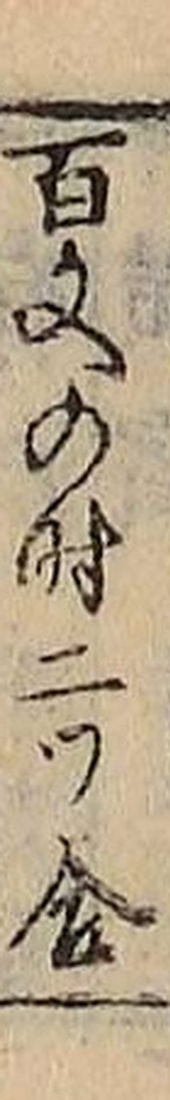百文の時二ツ合
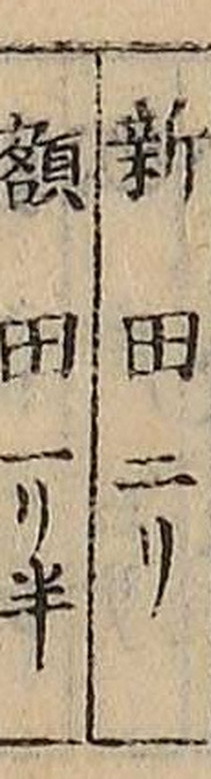額田一リ半
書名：旅行用心集
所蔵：神戸大学附属図書館 国文学研究資料館
